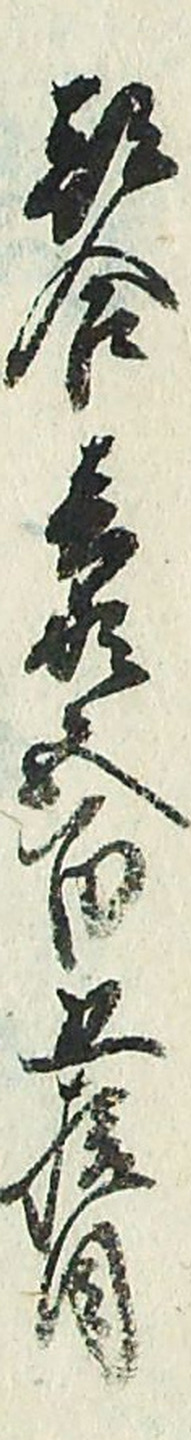都合一貫五百五十目
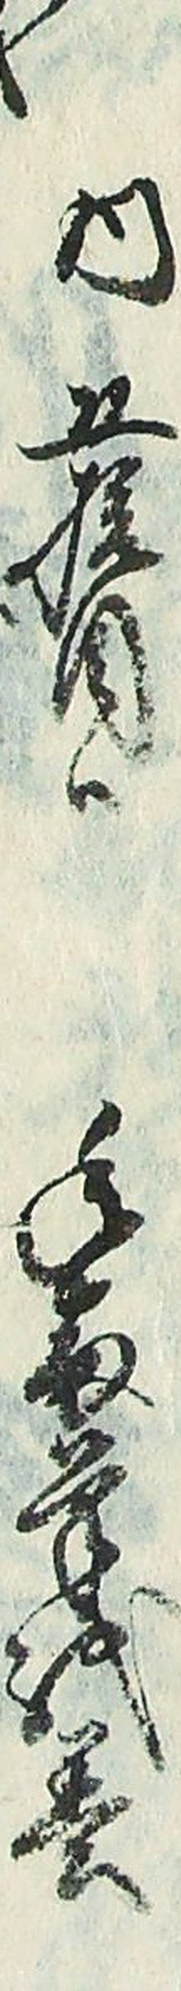内五十目は年番筆紙墨
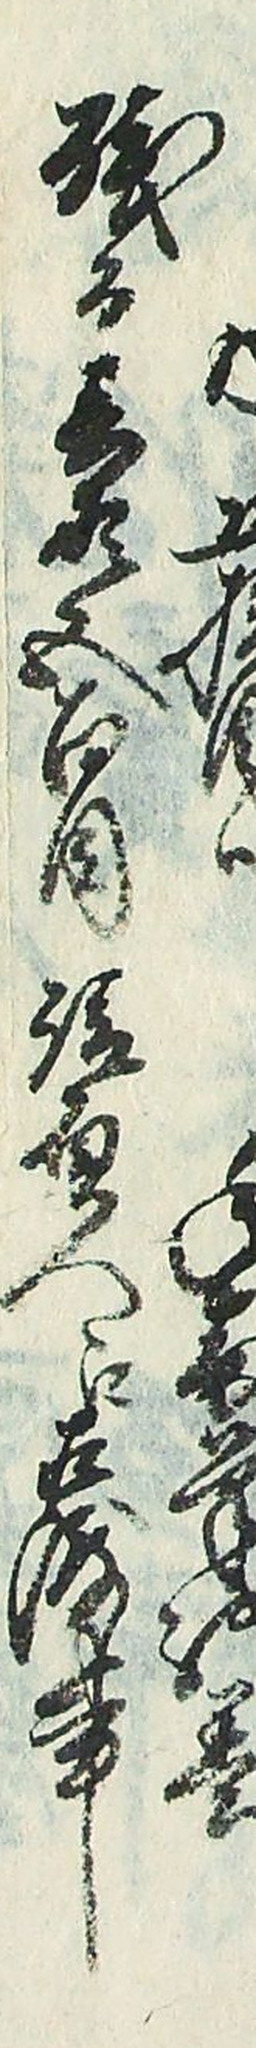残而一貫五百目請負人え相渡事

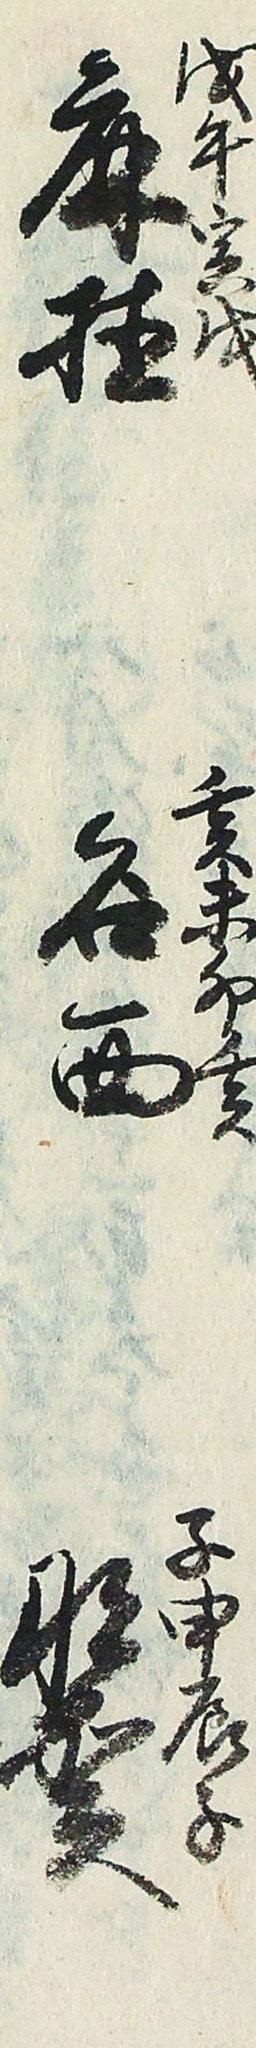麻植名西那賀
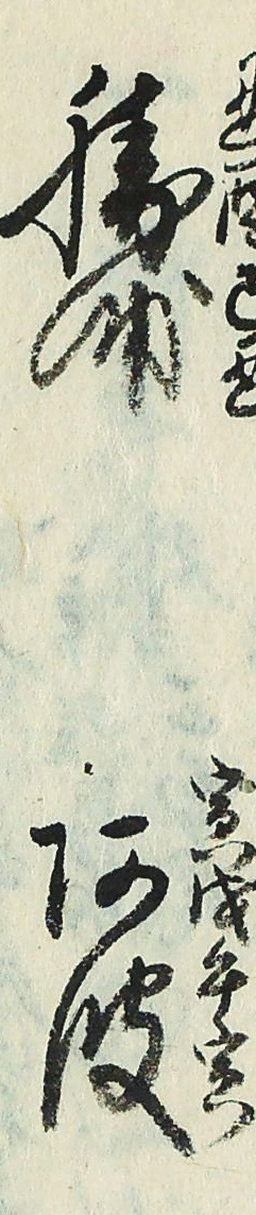勝浦阿波
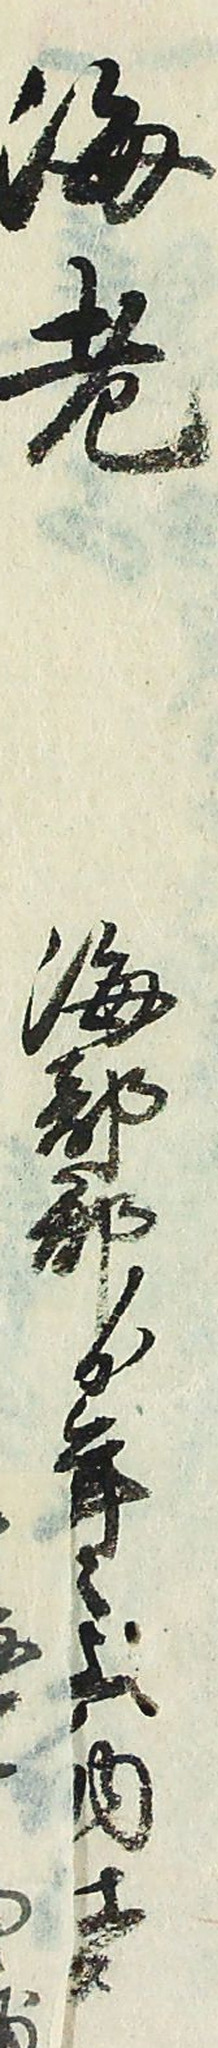海老海部郡より年々上納仕候
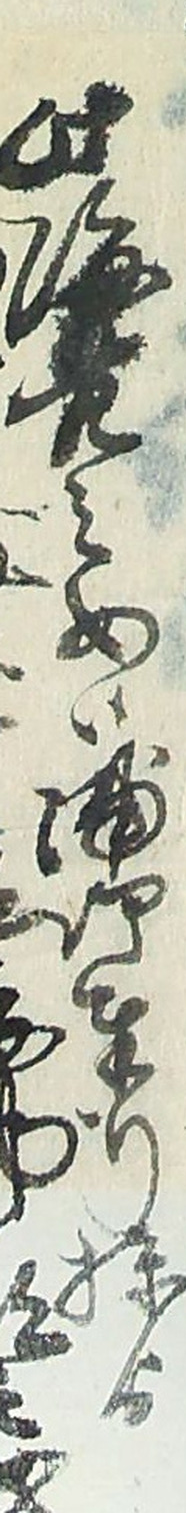此海老之義は浦御奉行様より
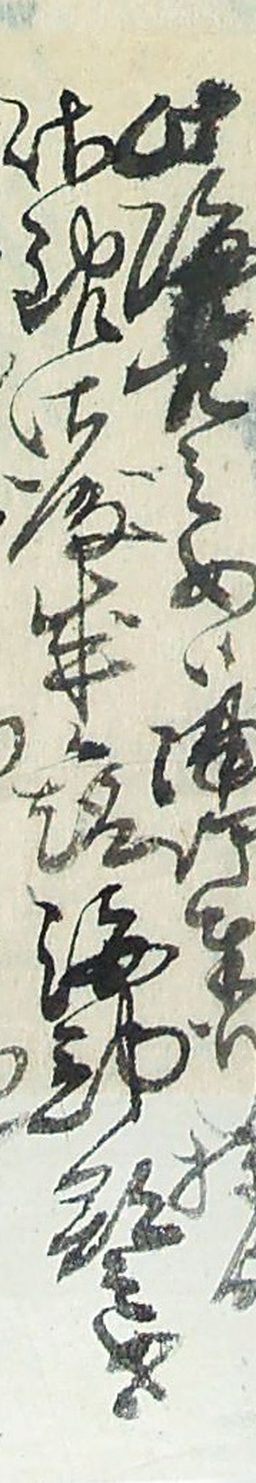代銀御渡成候趣海部郡の義
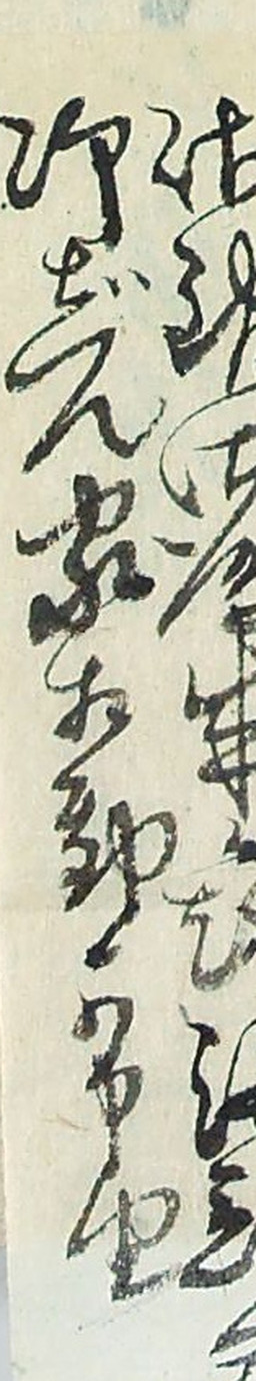御じん家相勤可申由
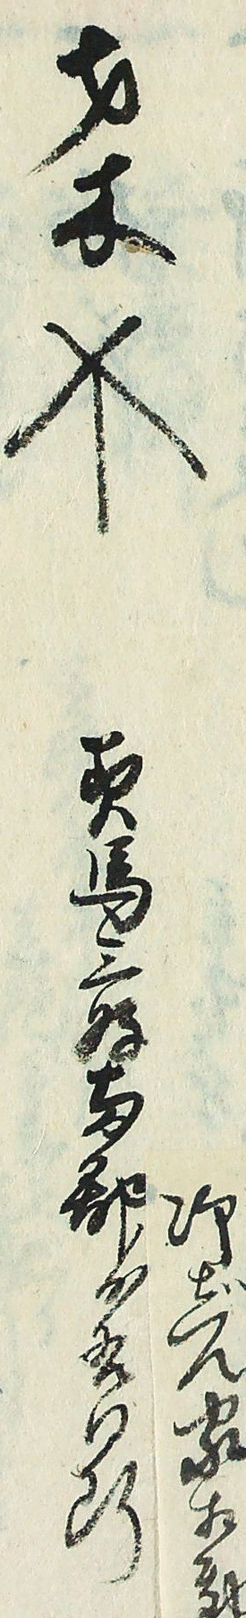才木美馬三好両郡より右同断
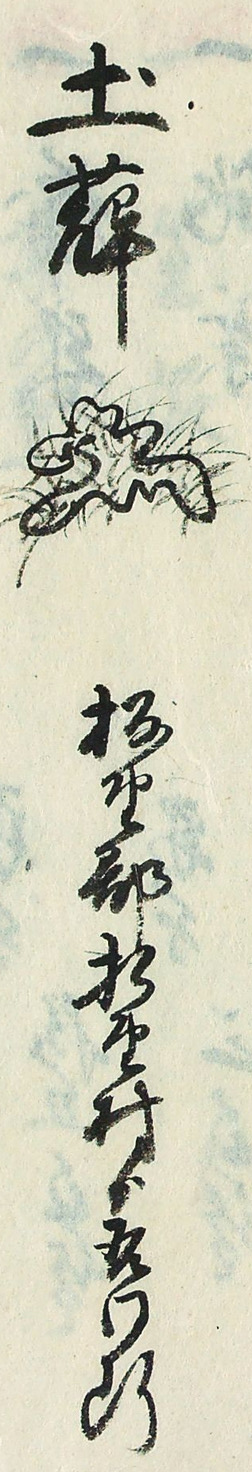土板野郡折野村より右同断

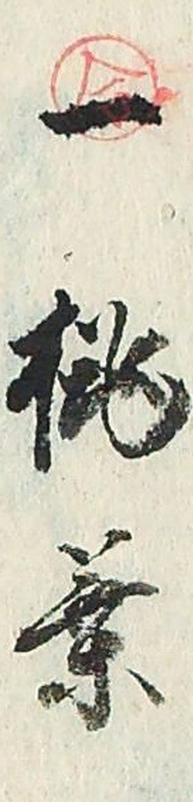一桃花
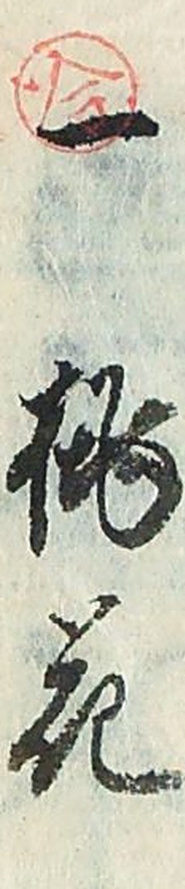一桃花
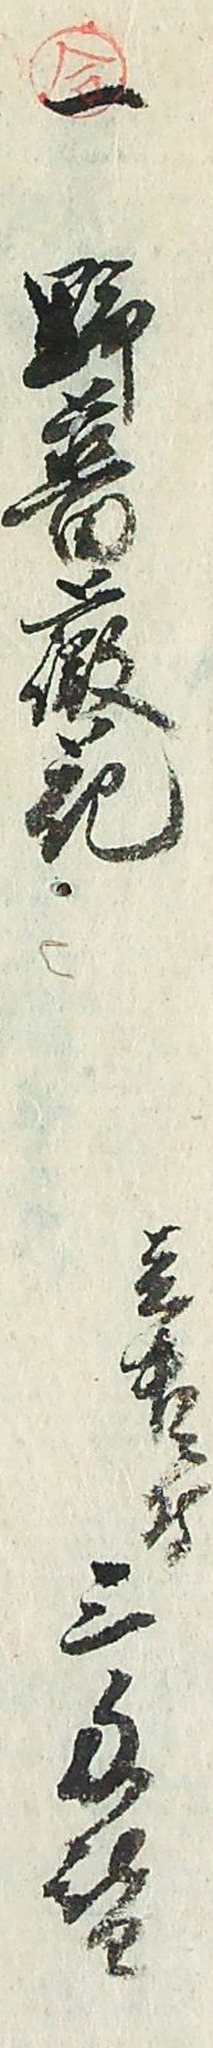一野薔薇花一舛に付三匁替
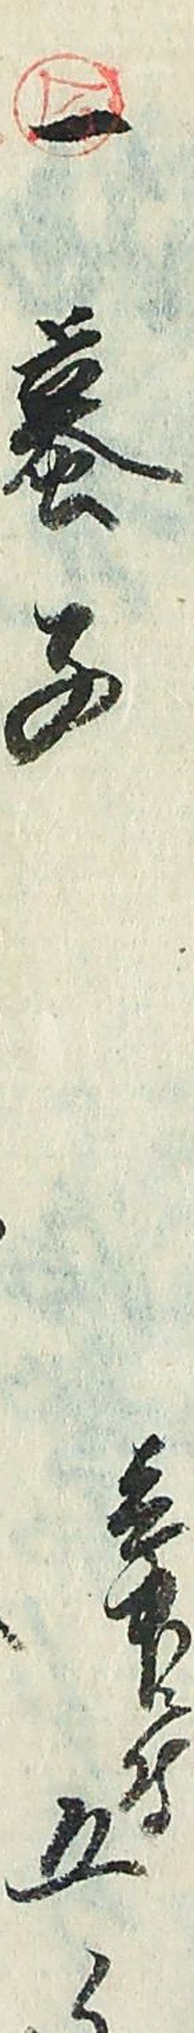一蟇子一舛に付五匁替
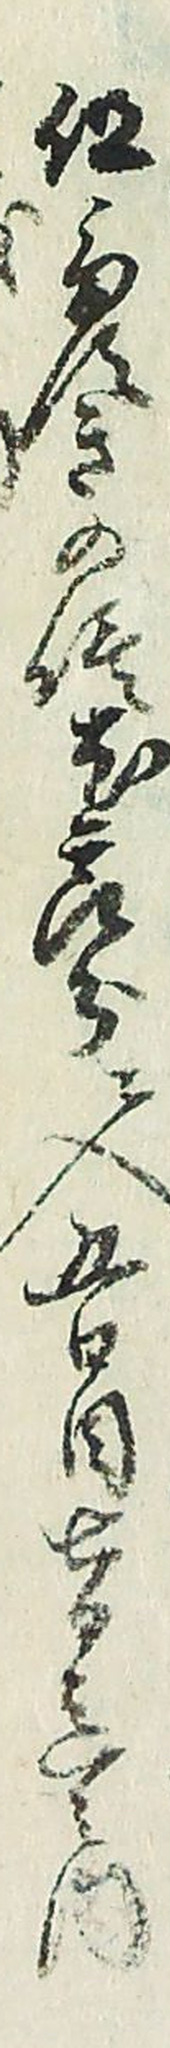但たすきの儘尤節分に入五百目七日迄の内
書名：諸割賦物賃銀定記録帳
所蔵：鳴門教育大学 Naruto University of Education
